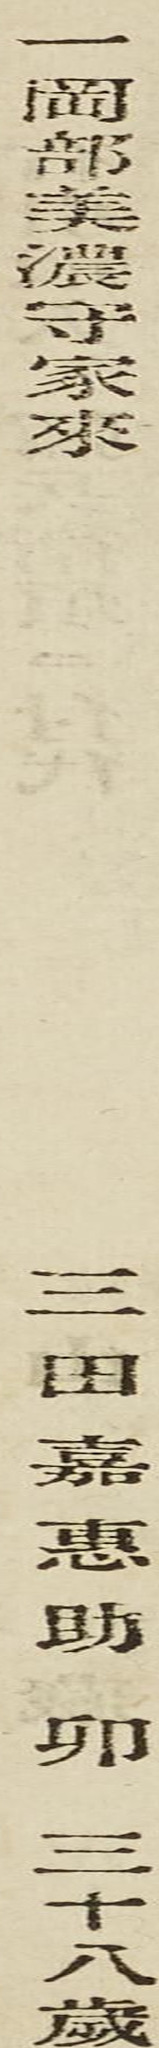一岡部美濃守家来三田嘉恵助卯三十八歳
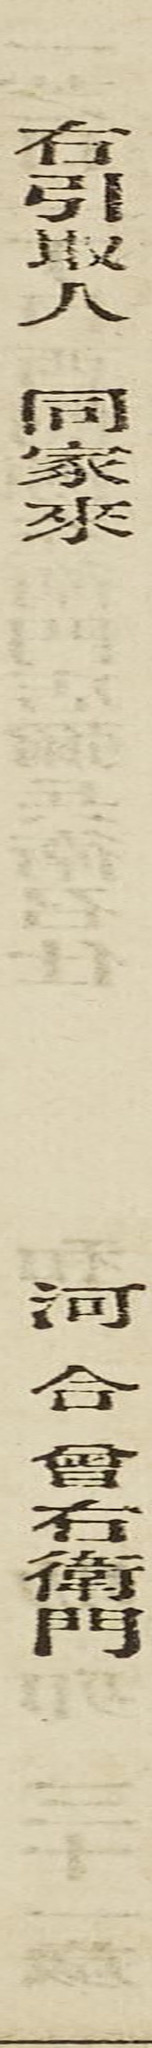右引取人同家来河合曾右衛門
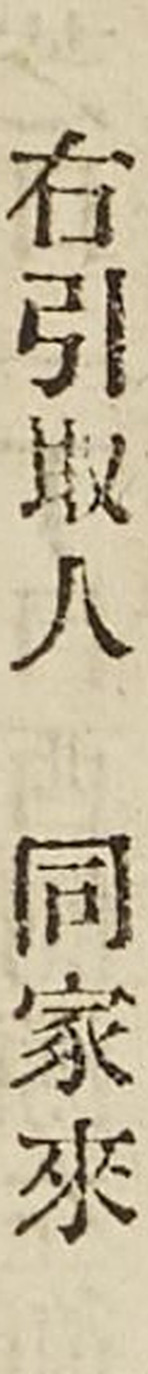右引取人同同
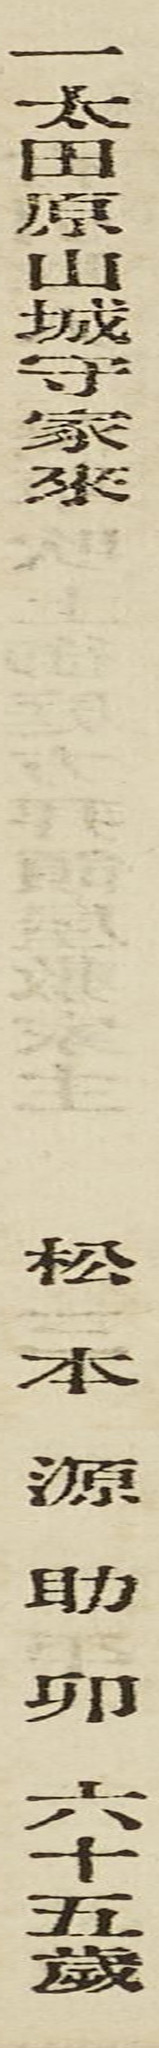一太田原山城守家来松本源助卯六十五歳
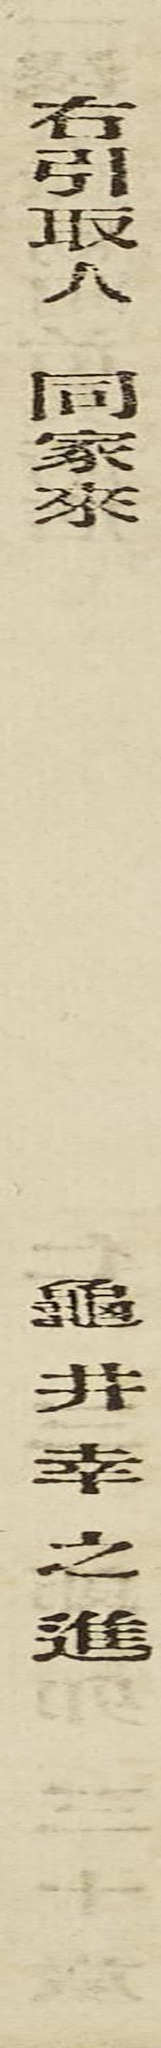右引取人同家来亀井幸之進
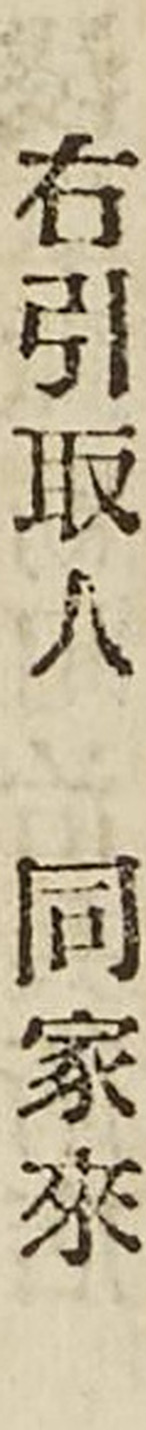右引取人同同
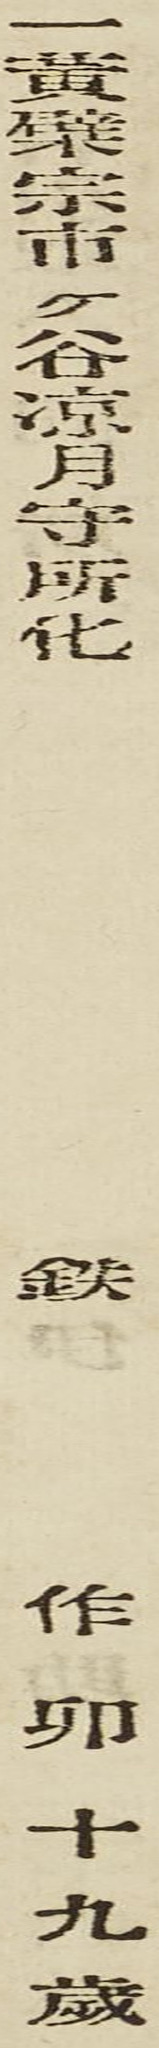一黄檗宗市ヶ谷涼月守所化鉄作卯十九歳
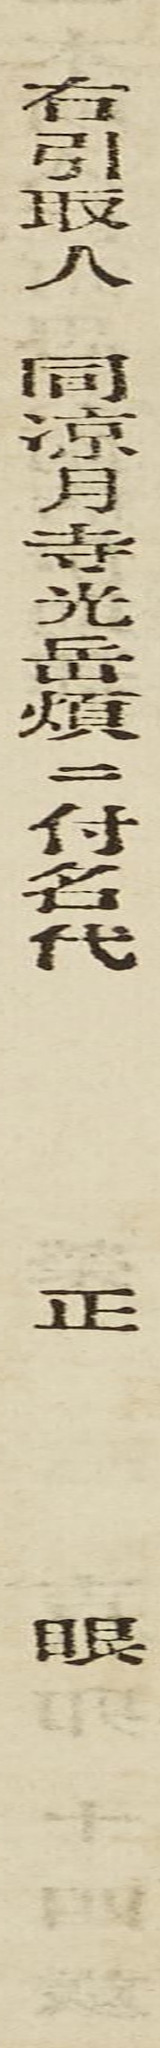右引取人同涼月寺光岳煩ニ付名代正眼
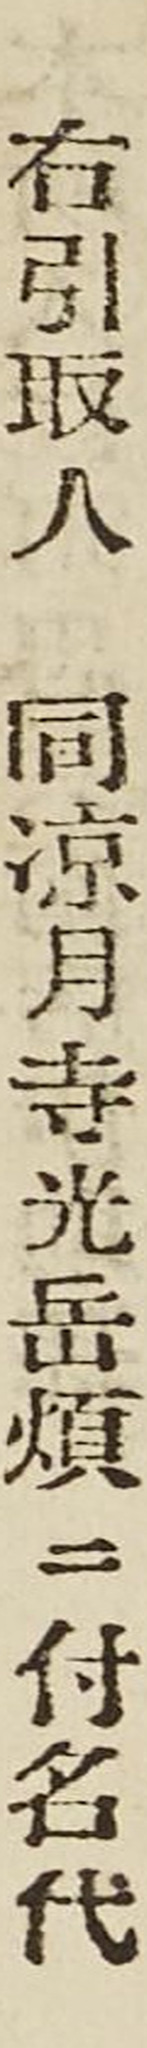右引取人同涼月寺光岳煩ニ付名代正眼
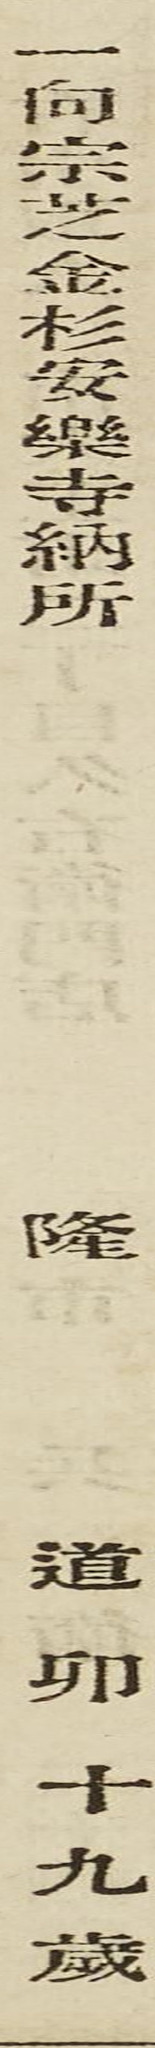一一向宗芝金杉安楽寺納所隆道卯十九歳
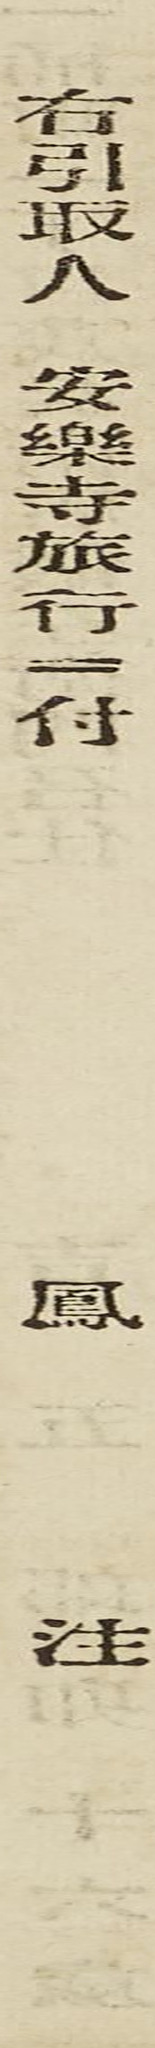右引き取人安楽寺旅行ニ付鳳注
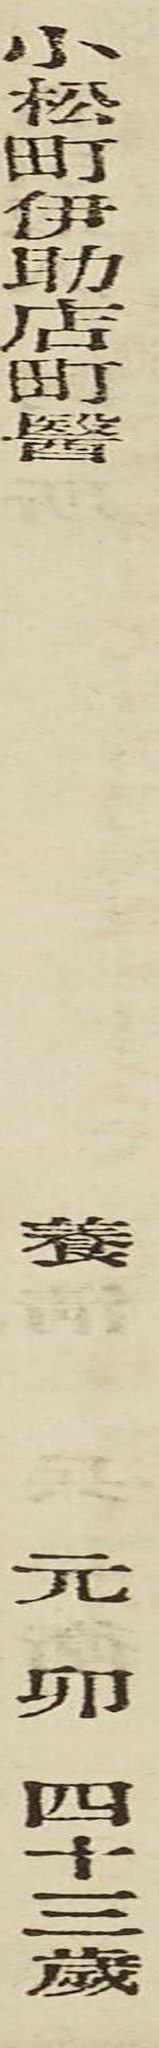一小松町伊助店町医養元卯四十三歳
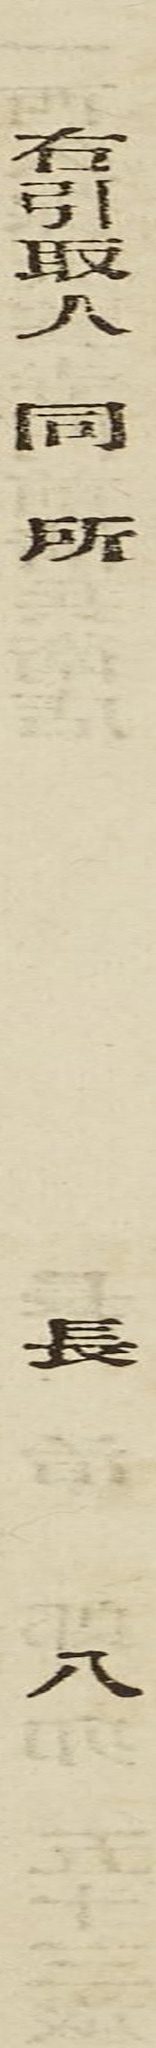右引取人同所長八
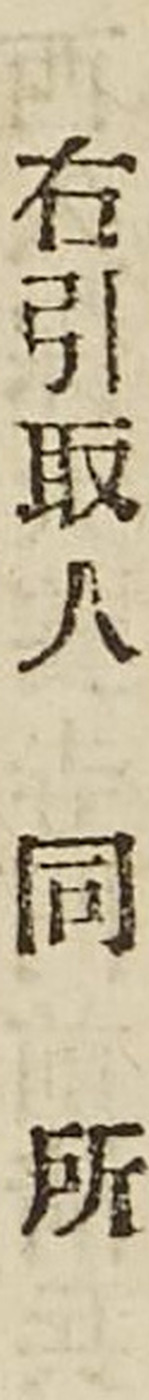右引取人同同
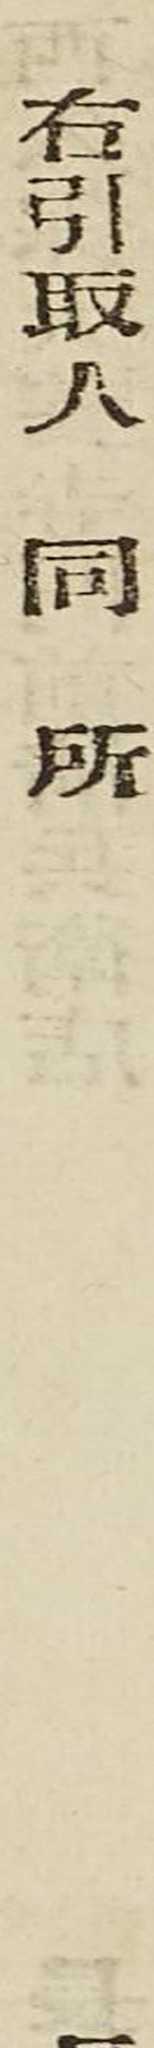右引取人同同
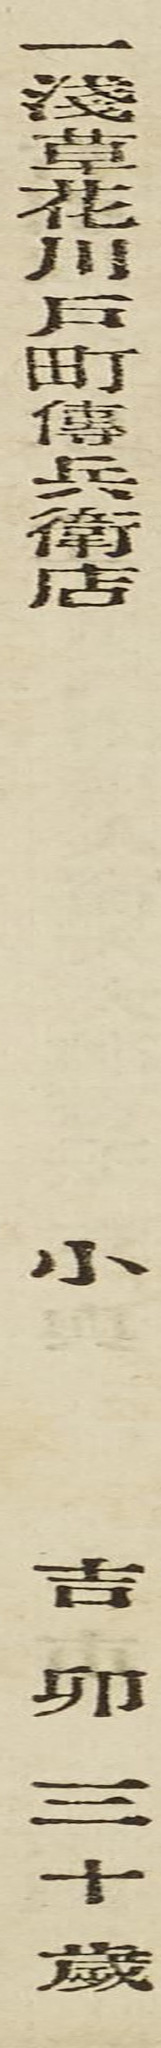一浅草花川戸町伝兵衛店小吉卯三十歳
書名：永代惨話　文化の夢　全
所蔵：東京大学地震研究所図書室 Earthquake Research Institute Library, The University of Tokyo, JAPAN
